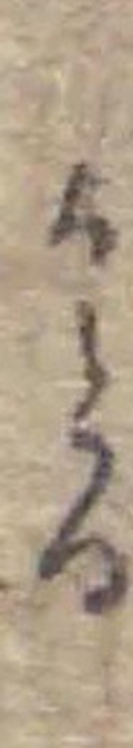おとる
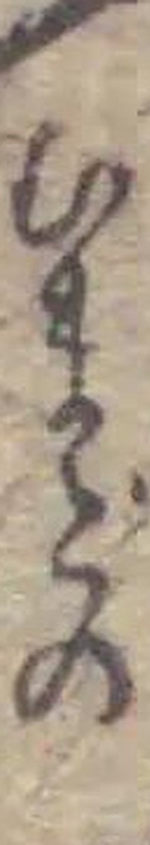むまどの
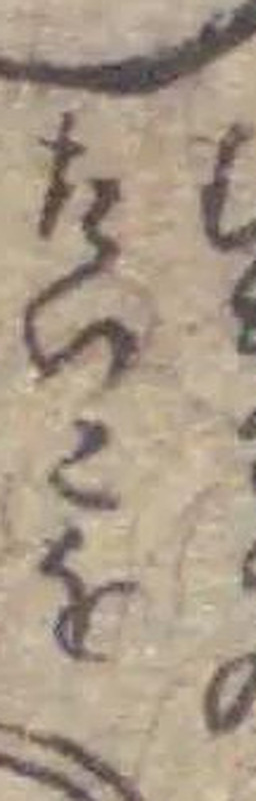たいこを

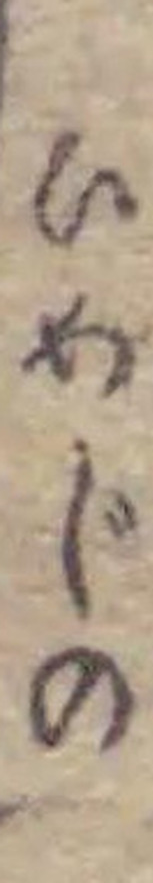ひめじの
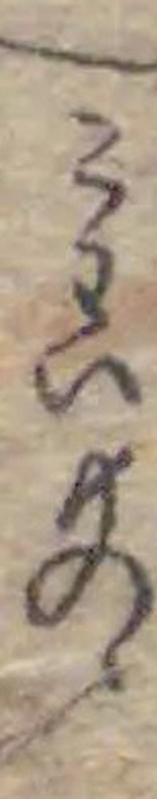こわいものゝ
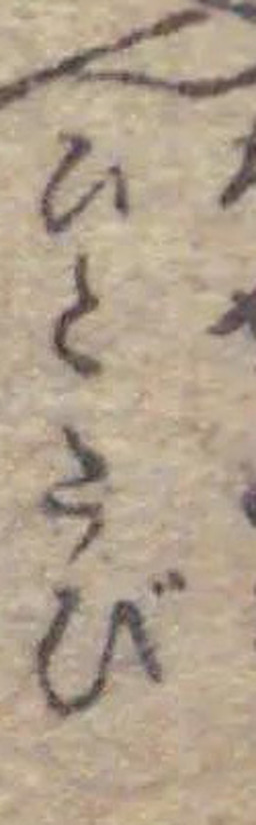ひとたび
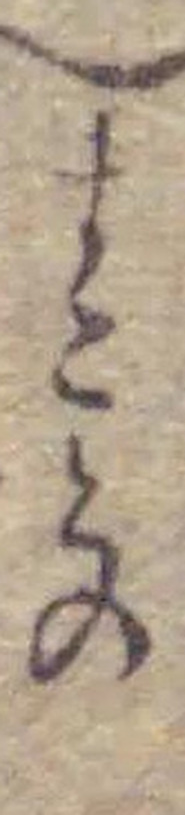まことの
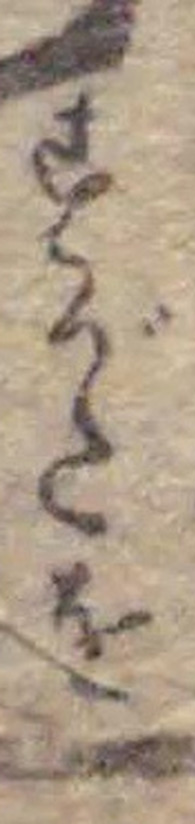すがたを
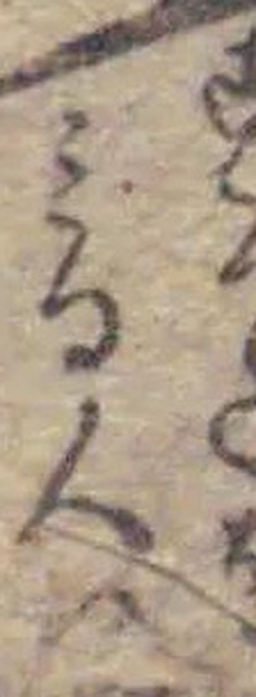みる人は
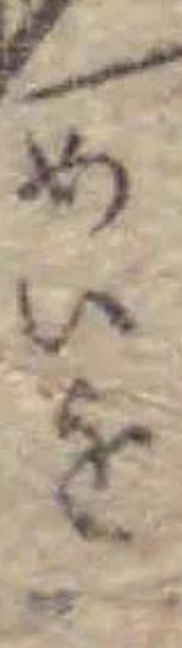めいを
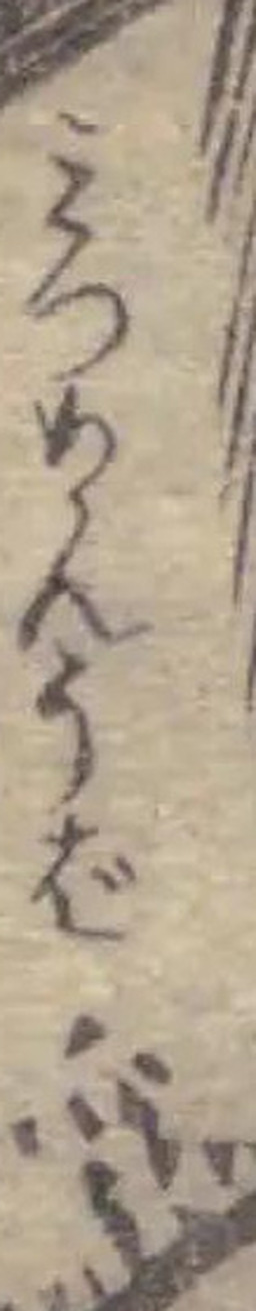みつめんうば
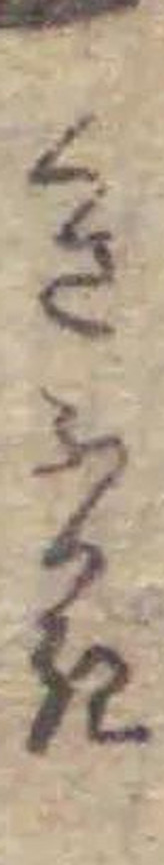くさふかき
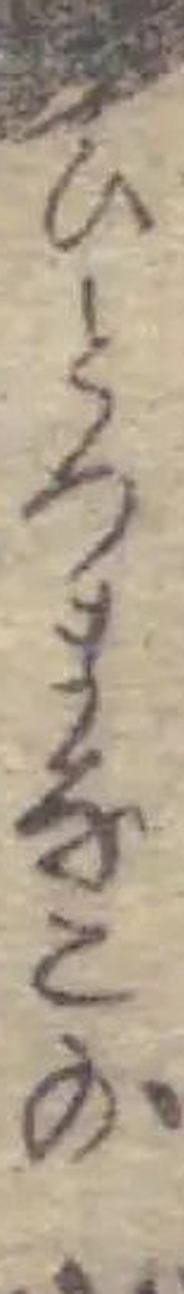ひとつまなこの
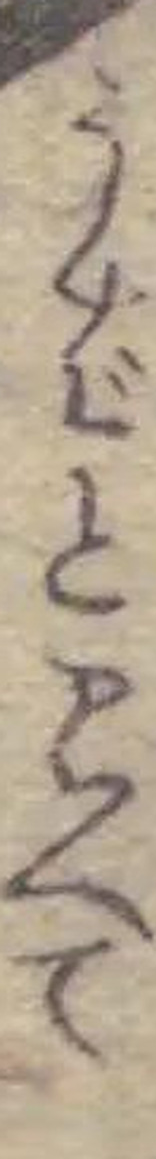うばと見へて
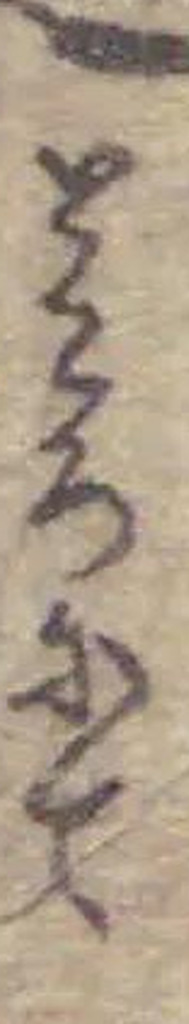ところにて
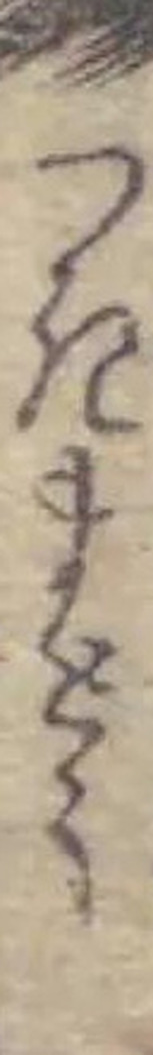つきまとう
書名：夭怪着到牒 2巻
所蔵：国立国会図書館 National Diet Library, JAPAN
